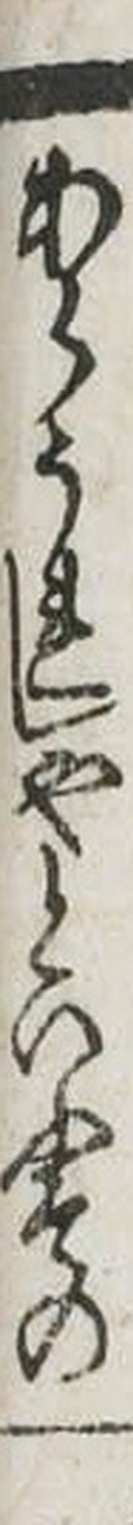あらうれしやといふその
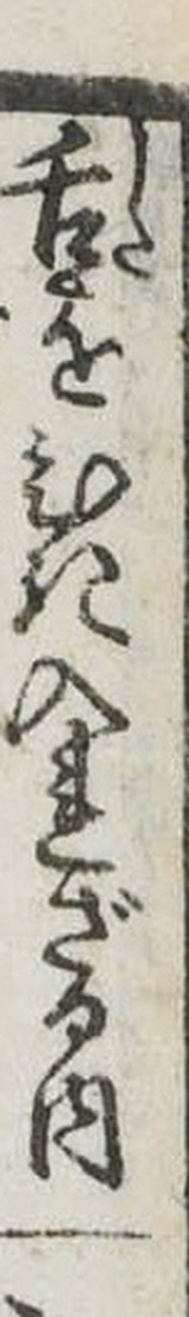舌をひき入れざる内
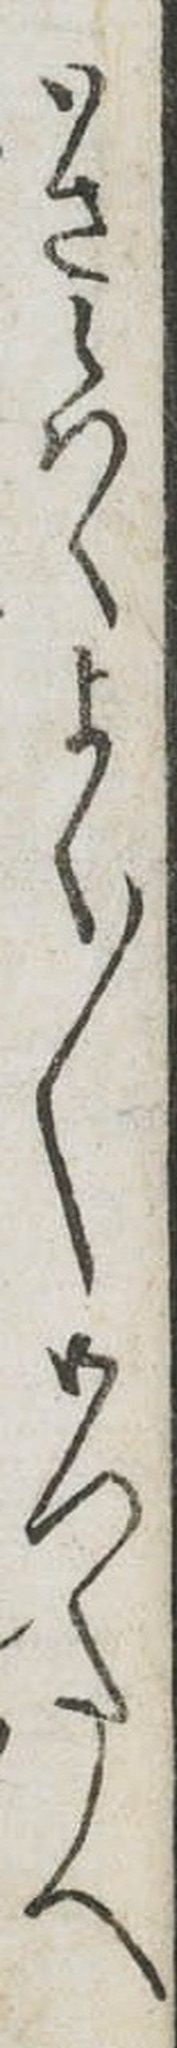御さ候はゝよく〳〵御つたへ
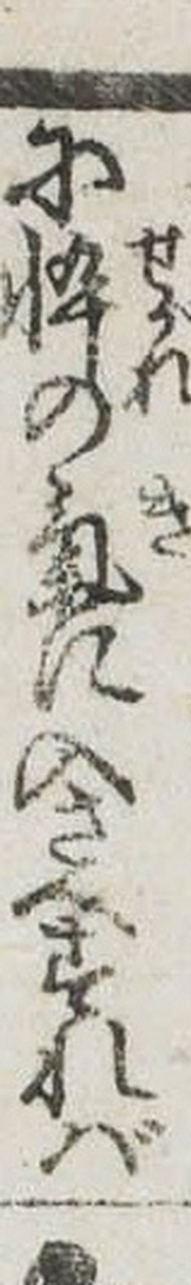に忰の気に入さへすれば
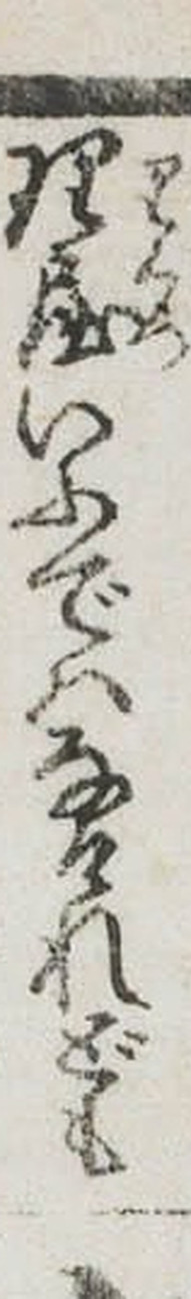理屈いふではなけれども
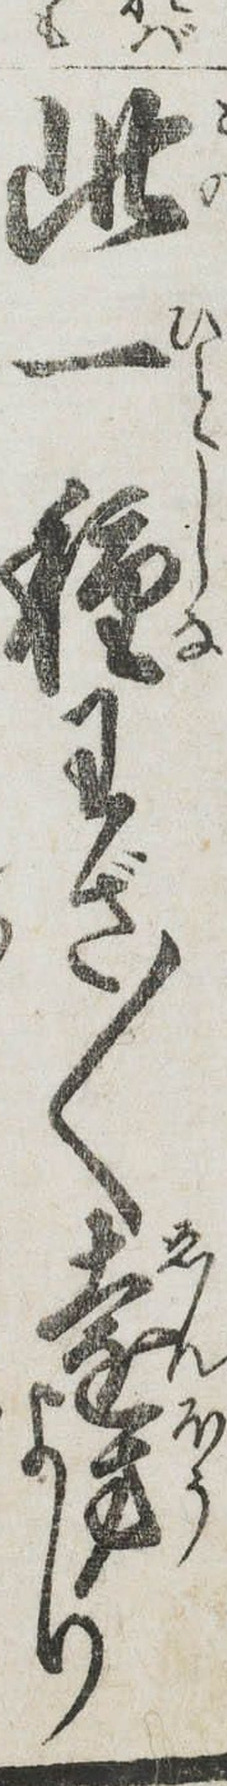此一種わざ〳〵遠方より
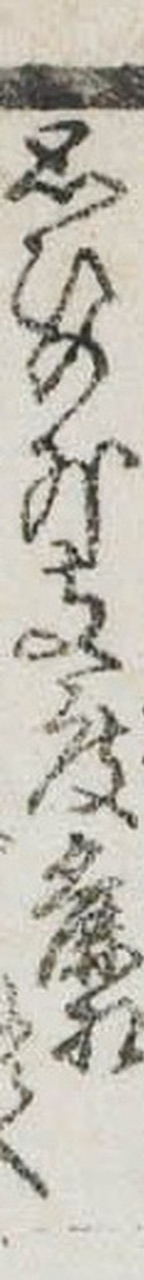思ひの外支度麁相
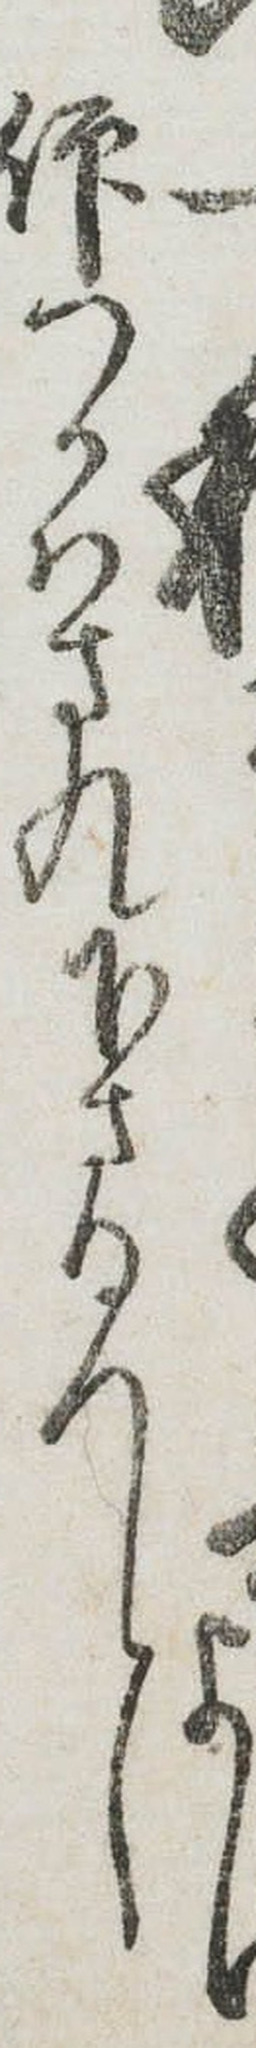仰つかはされ下さるへく候
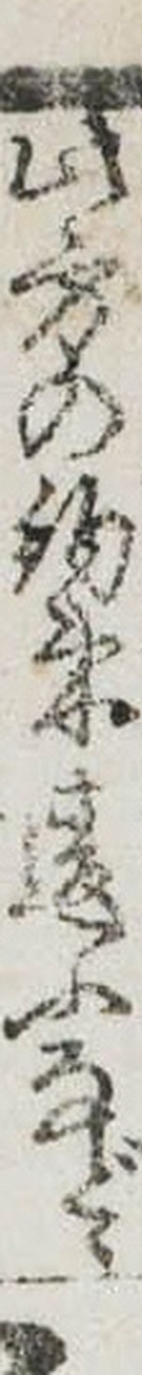此方の約束違ふなどゝ
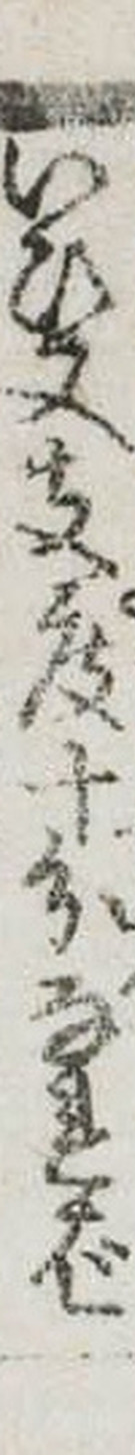いひ又支度十分なれば
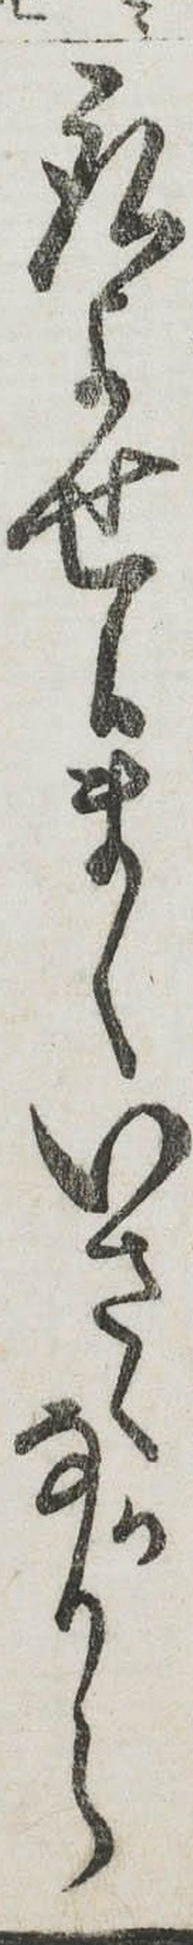取よせ候まゝいさゝかなから
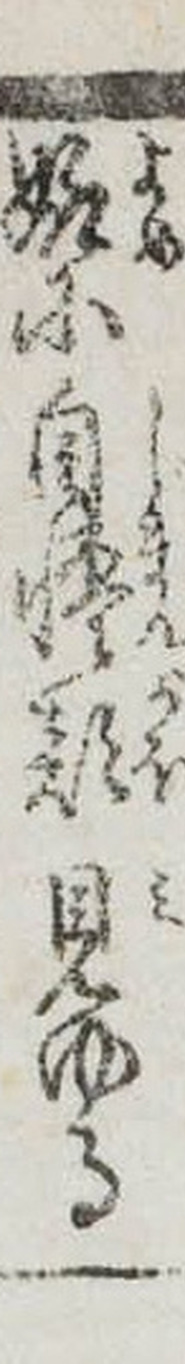娵に自慢顔見ゆる
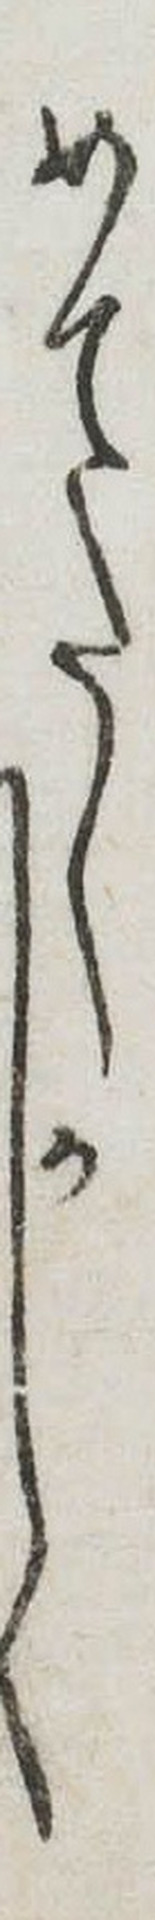めてたまかしく
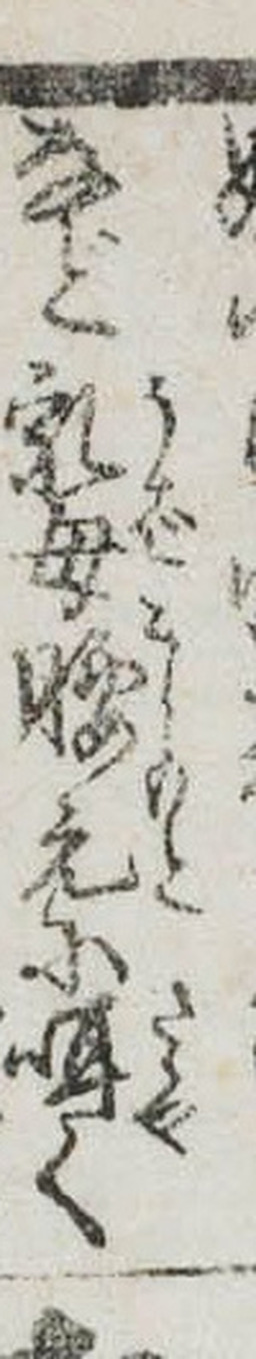など乳母腰元に囁く
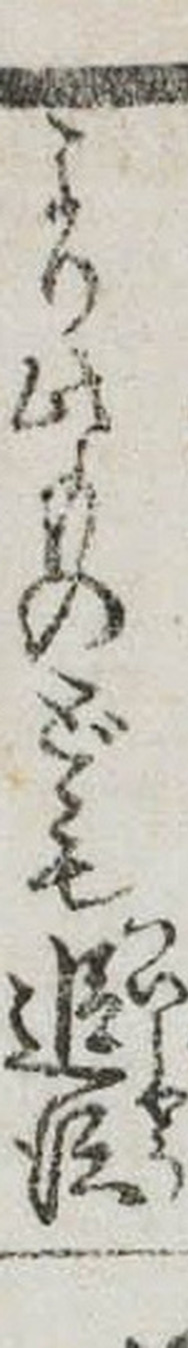より此ものども追従
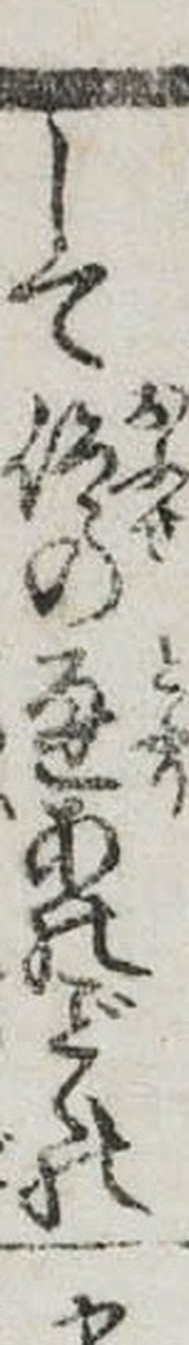して仰の通あのごとくの
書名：頭書萬用婦人手紙之文言
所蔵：東京学芸大学教育コンテンツアーカイブ
